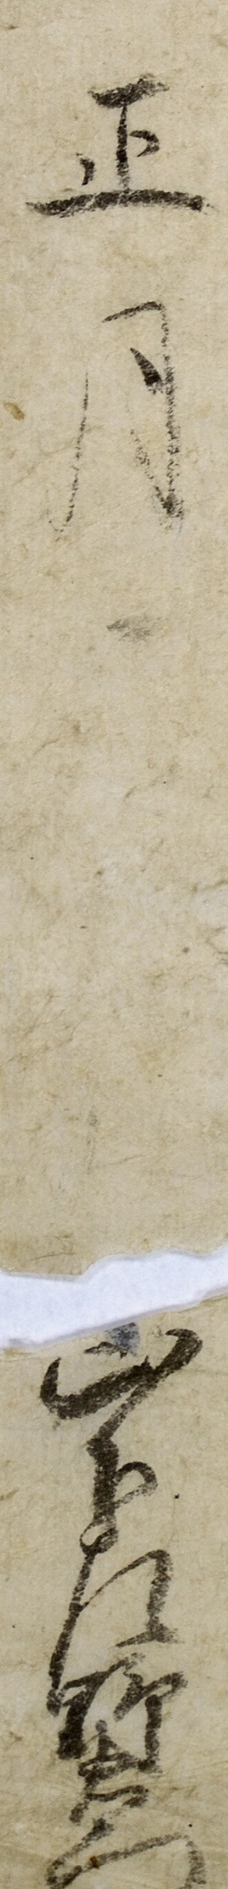正月山下左野右衞門
